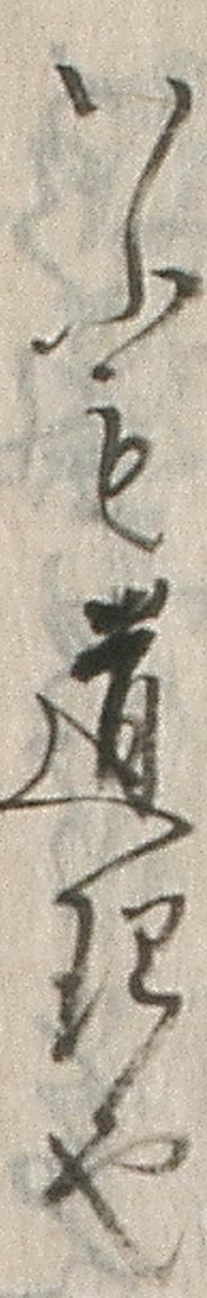いふも道理也
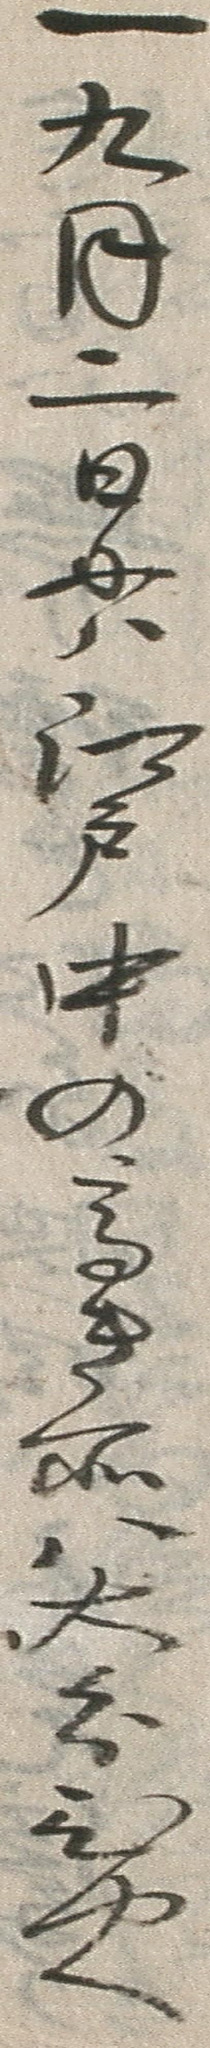一九月二日には江戸中の高き所は大分ひゆへ
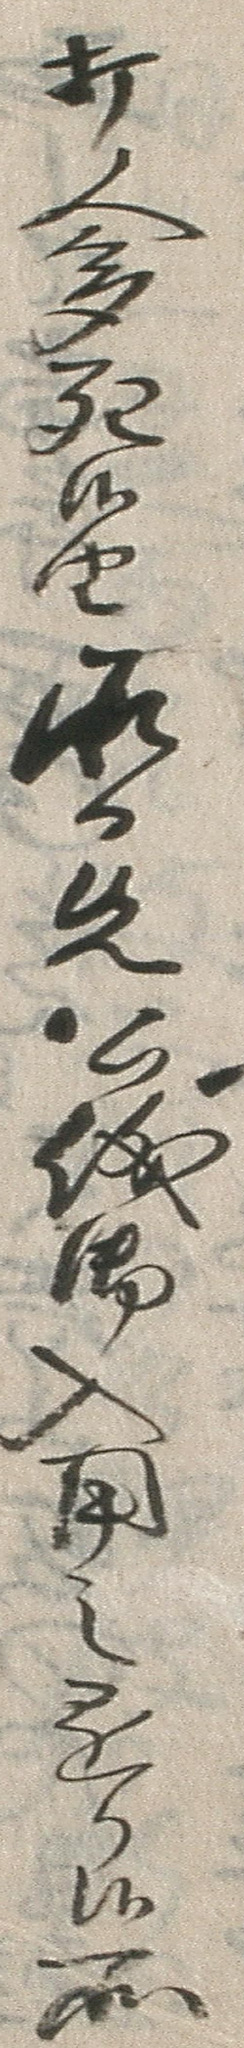打人多死候由承る先公儀御入用之懸り候所
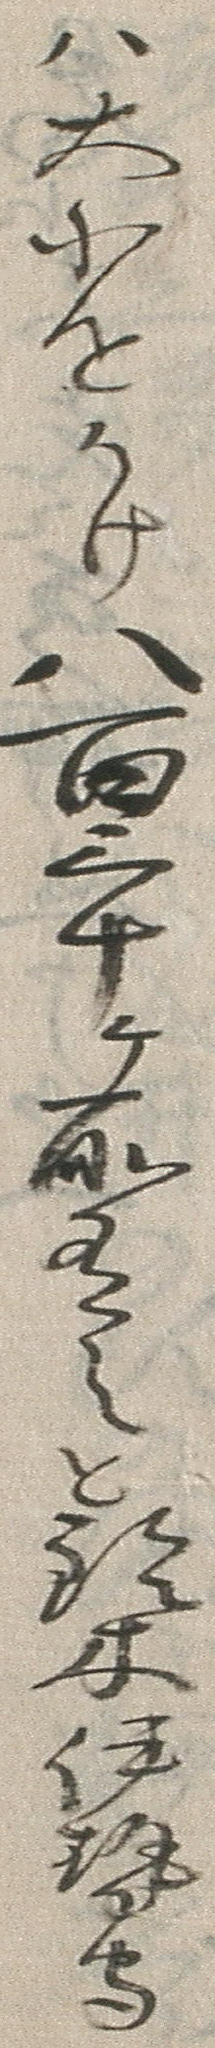は大小をうけ八百三十ケ所有之と鈴木伊勢守
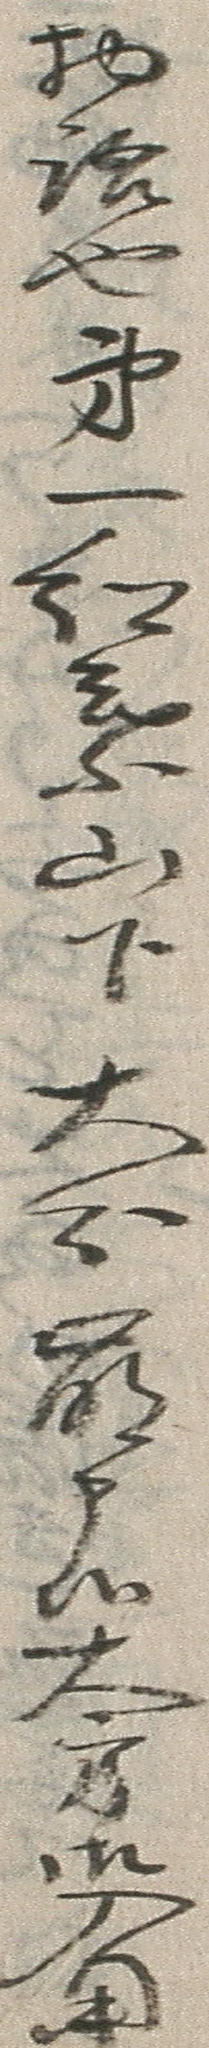物語也第一紅葉山下大分崩申候大方御入用
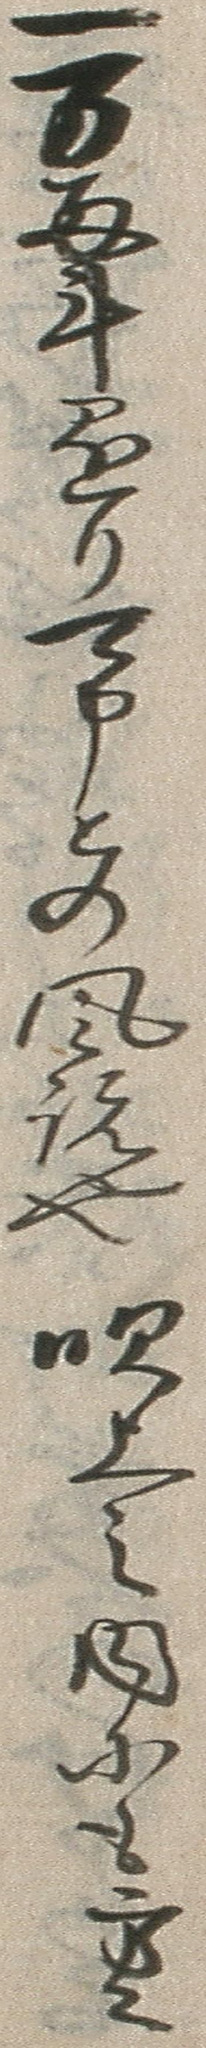一万両計懸り可申との風説也吹上之内にも方々
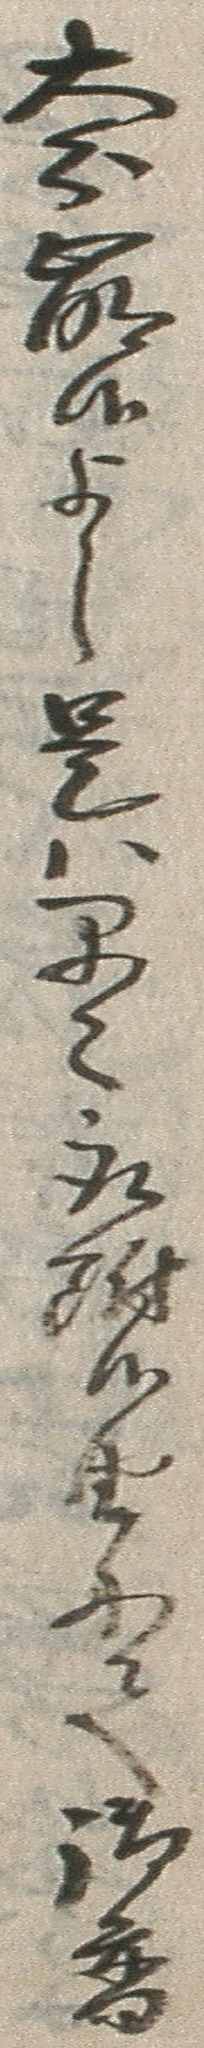大分崩候よし是は早々取附候由にて御普
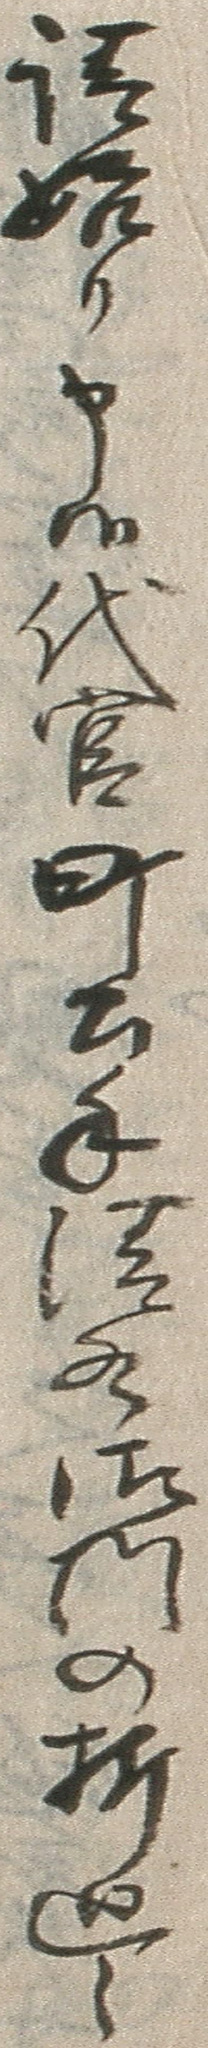請始り申候代官町土手清水御門の折廻し
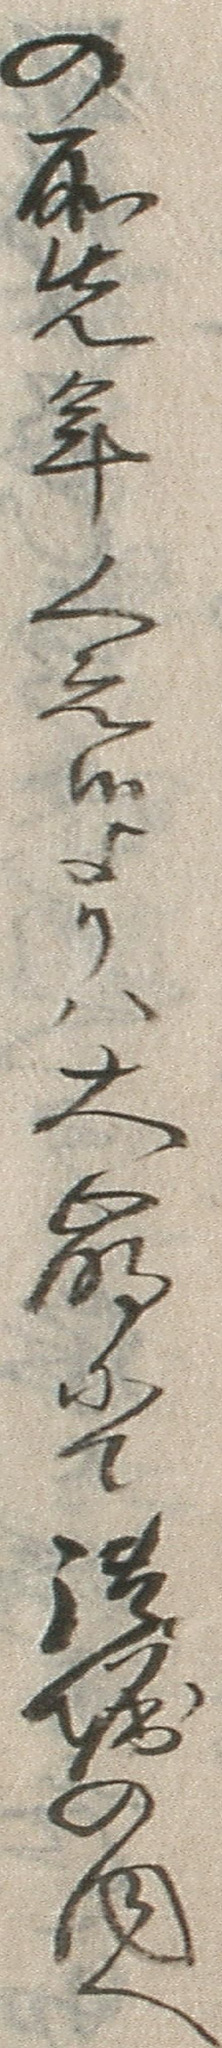の所先年くえ候よりは大崩にて御堀の内へ
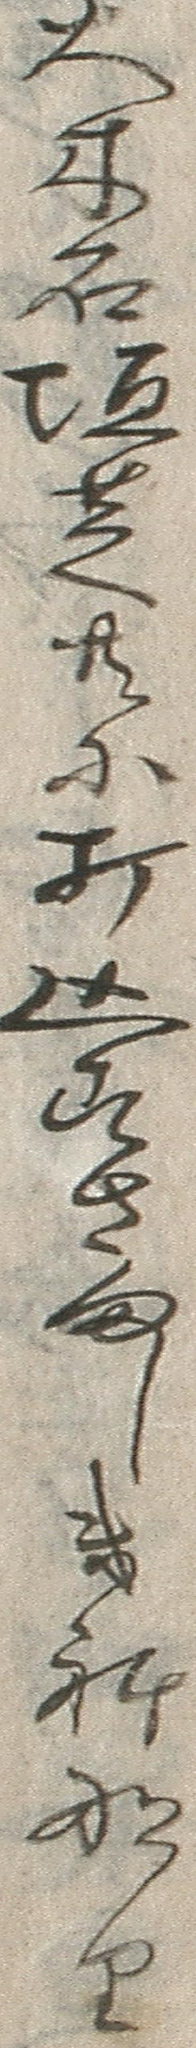大木石垣芝共に打込すさましき体なり
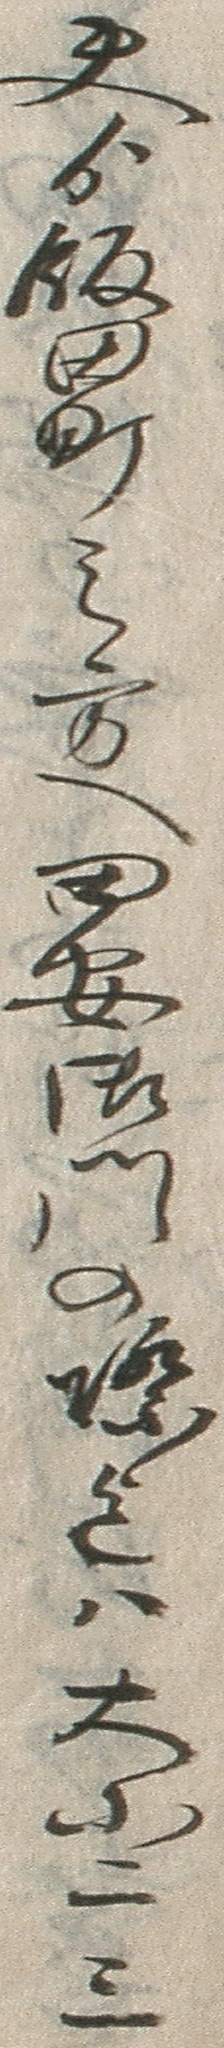夫ゟ飯田町之方へ田安御門の際迄は大小二三
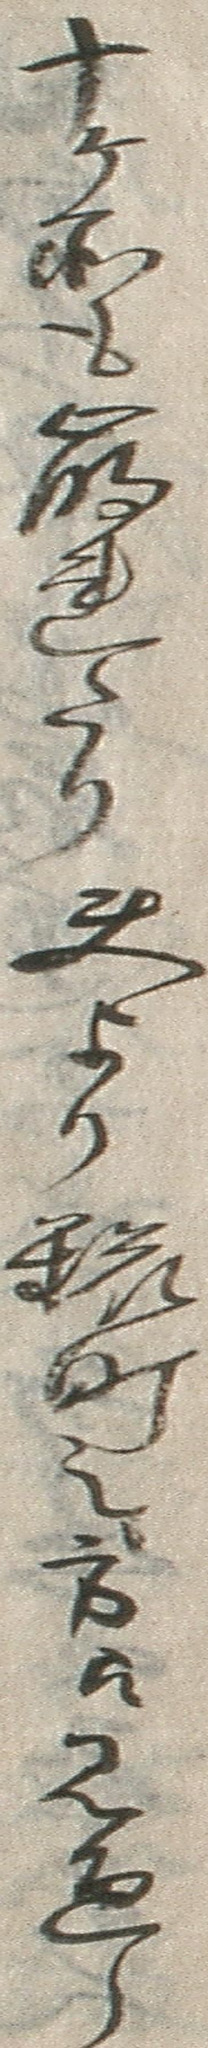十ケ所も崩れたり夫より糀町之方え見通し
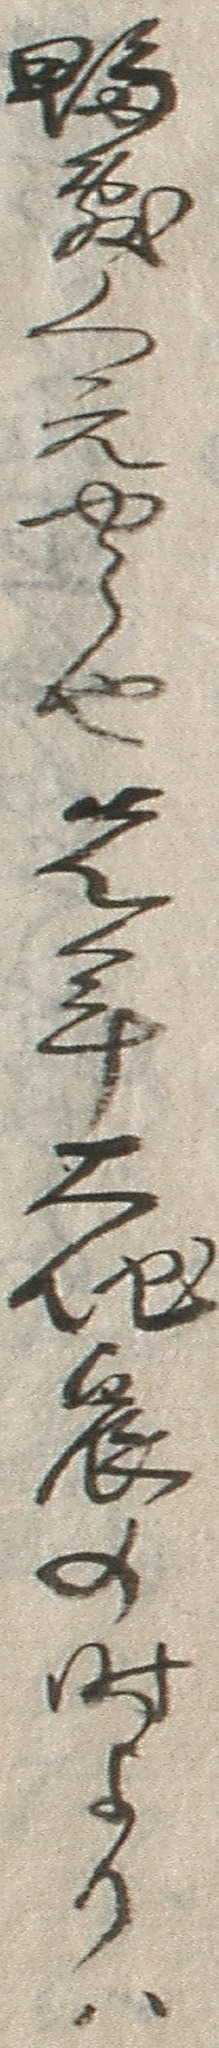夥敷くえやう也先年大地震の時よりは
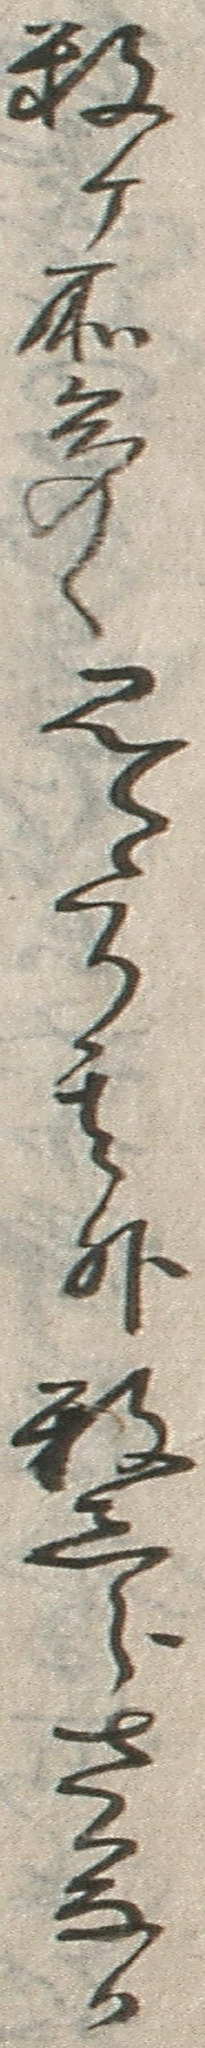数ケ所多く見へたり其外数しらさるなり

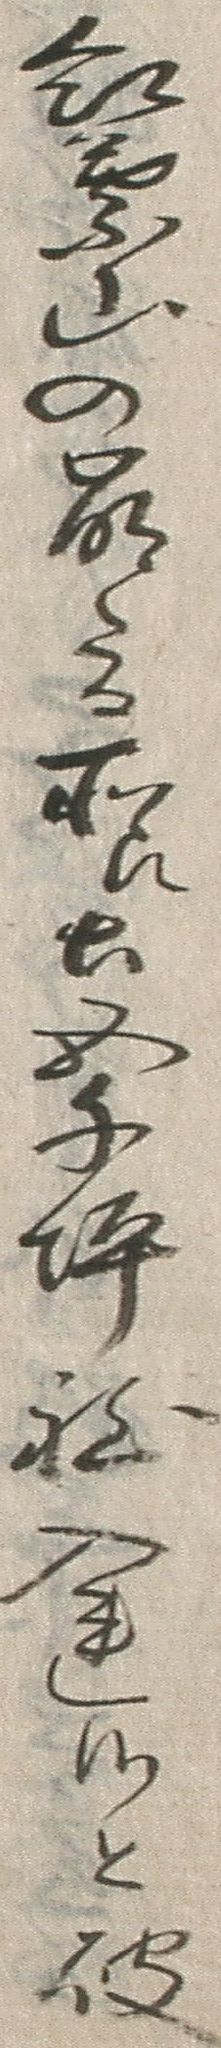紅葉山の崩たる所え土五千坪程入れ候と破
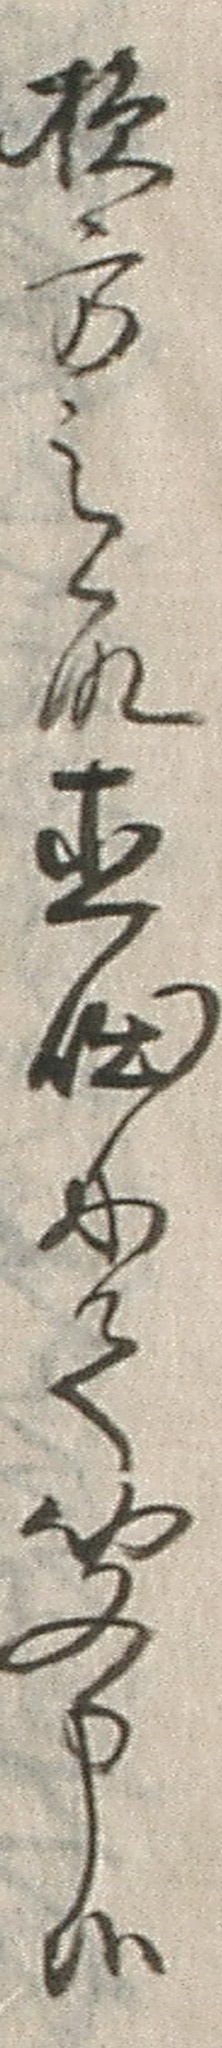損方之衆直咄にて聞申候
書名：享保十三年江戸洪水記
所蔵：東京大学地震研究所図書室 Earthquake Research Institute Library, The University of Tokyo, JAPAN
